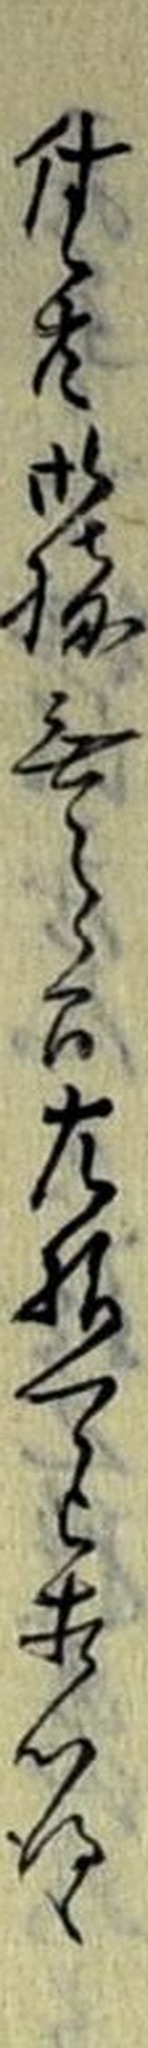付候共御構無之候間左様可被相心得候
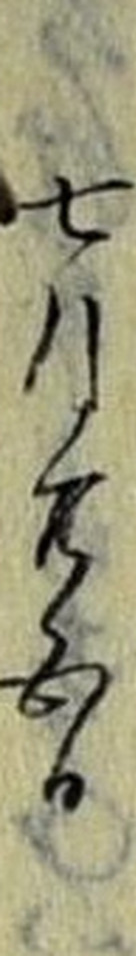七月廿五日
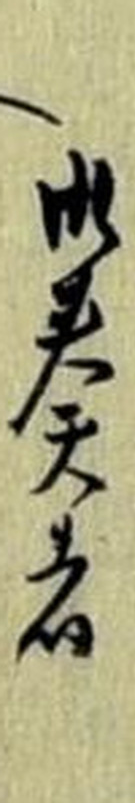御奏者
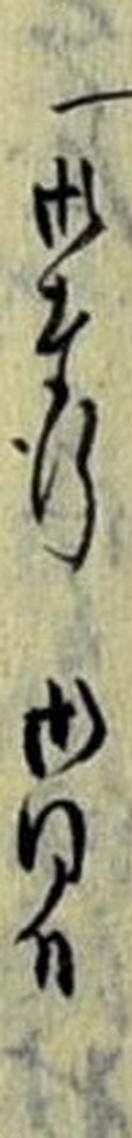御奉行御目付
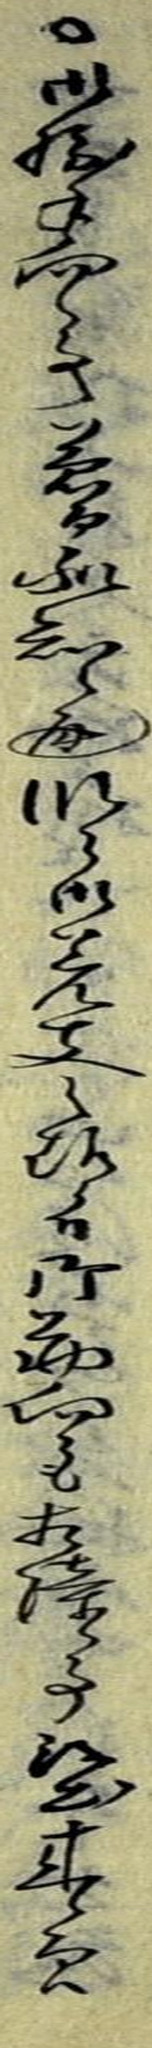〇御勝手向之事兼而承知之通段々御差支之趣に付御勤向にも相障候事致出来候而は
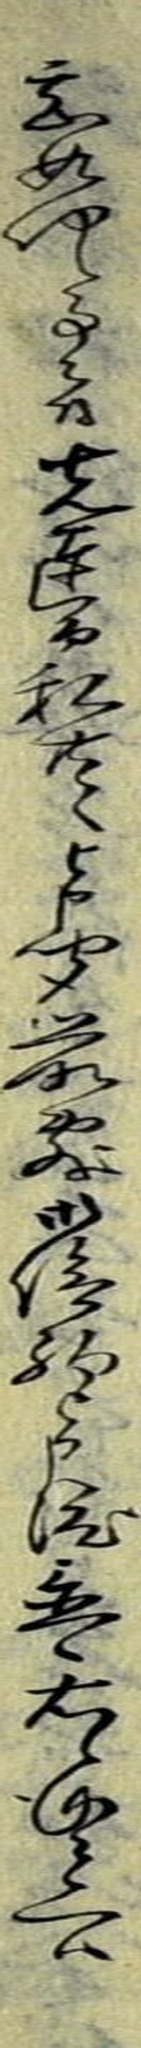甚如何之事に付先達而私共へ被申聞厳敷御倹約被申渡置候右之趣に候へは
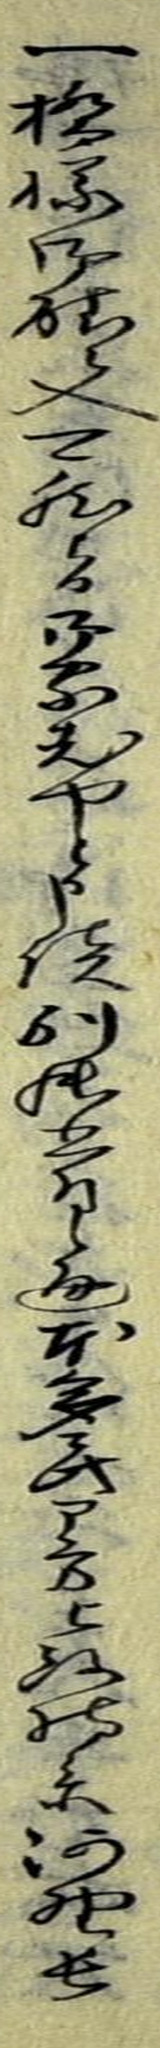一橋様御聴被入可然旨御家老中と申談別紙書付之通本多民部方被致持参河野長
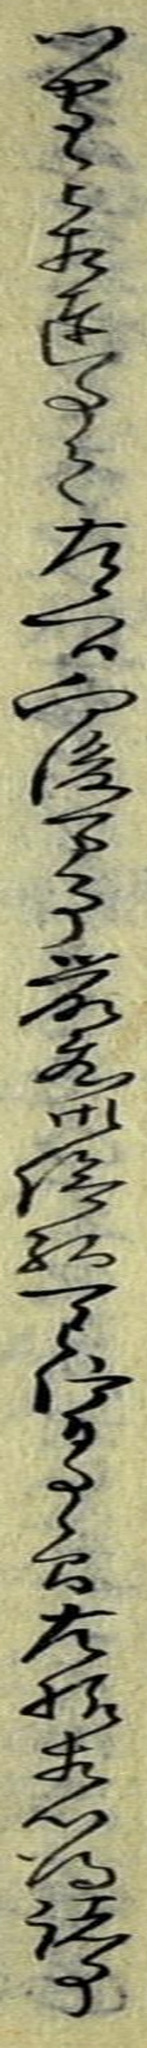門守へ被相達事に候左候へは向後万事厳敷御倹約可被仰付事候間左様相心得諸事
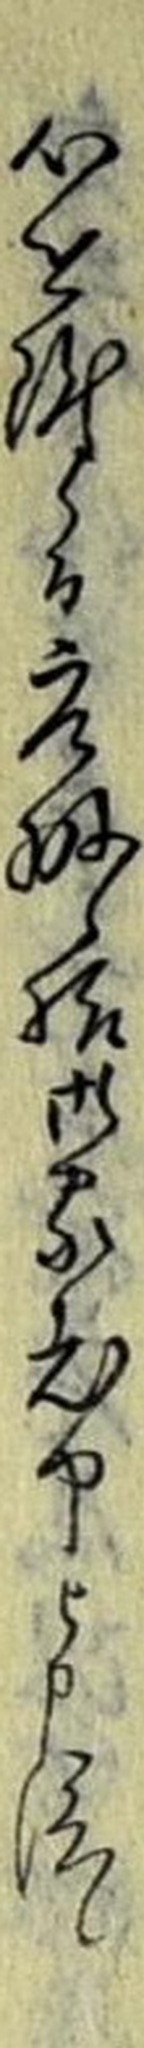心を附候而取扱候様御家老中被申渡候
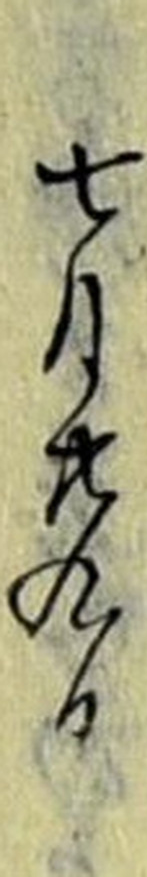七月廿九日

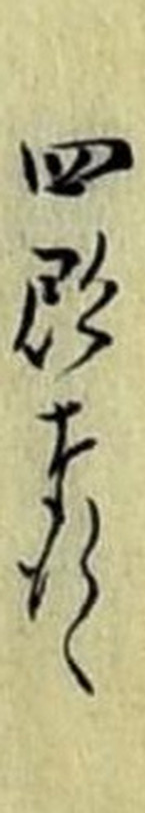四郡奉行へ
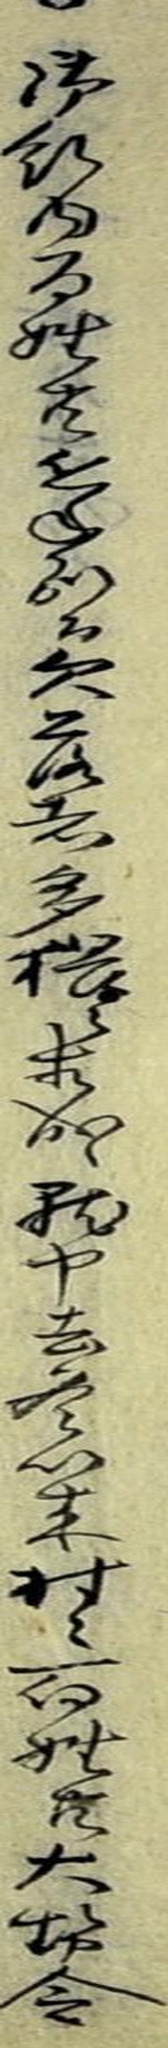〇御領内百姓共近年別而欠落者多猥に相成候就中去冬以来村々百姓共大勢令
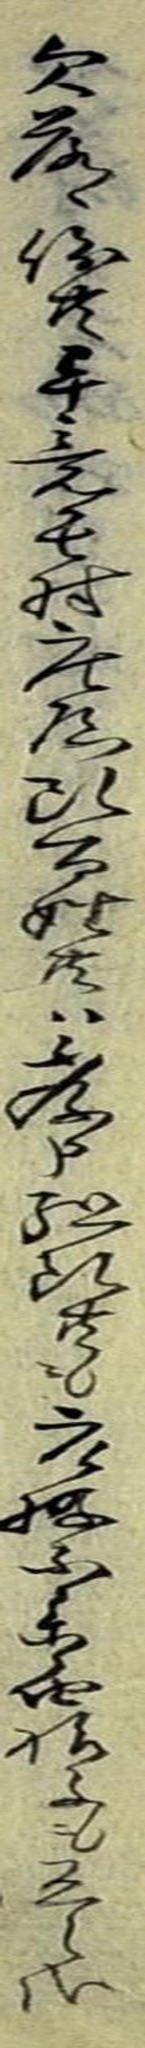欠落候儀共畢竟其村庄屋頭百姓共は不及申組頭共も取扱不参届様子も有之候哉
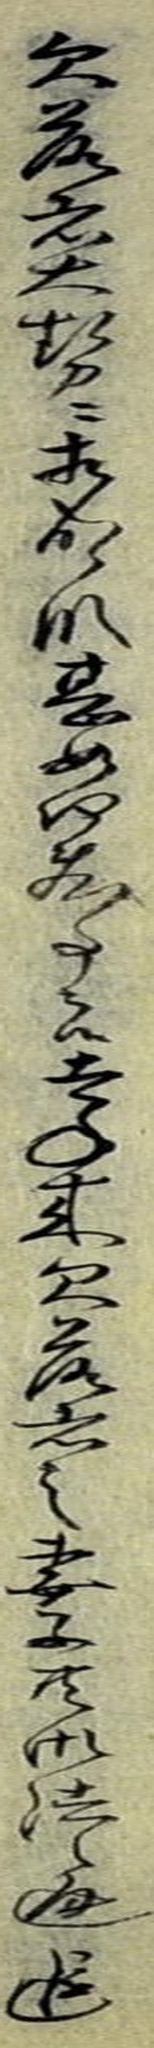欠落者大勢に相成候段甚如何敷事に候去年来欠落者之妻子共御法之通追
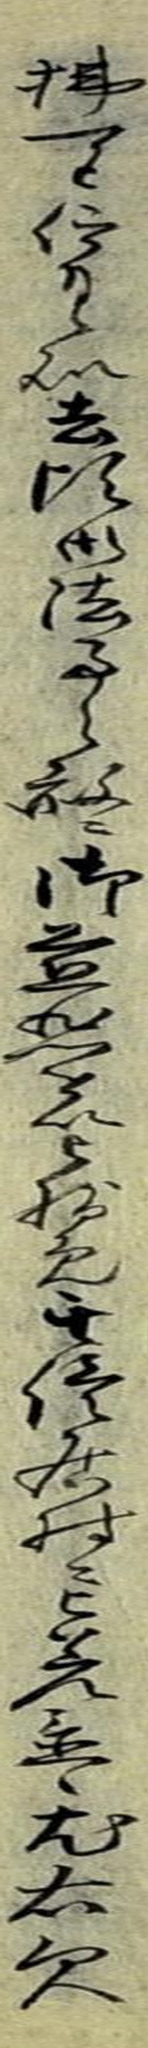払可被仰付候処去頃御法事之赦に御慈悲を以被指免其侭居村に被差置候尤右欠
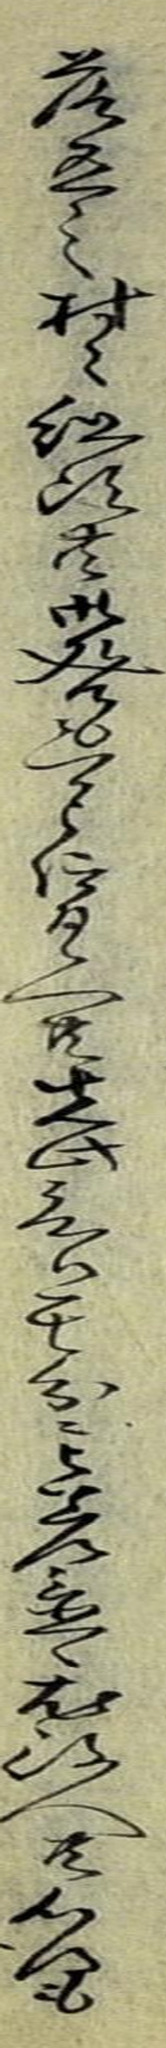落有之村々組頭共御咎も可被仰付候へ共先此度は其分に被差置候尤役人共心得も
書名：命令之部 二
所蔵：福井県文書館 Fukui Prefectural Archives
